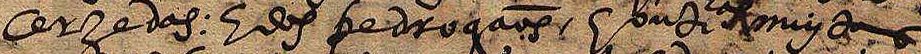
cerzedas: E dos pedrogaõs, E outras mujtas
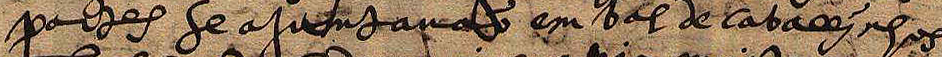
partes se aJumtauaõ em val de cavalljnhos
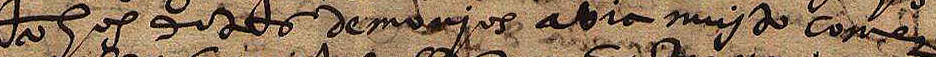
c̄o hos ditos demonjos avia mujto comer
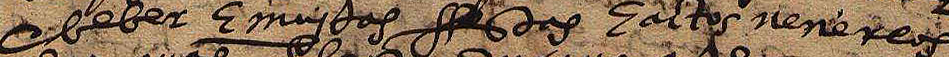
e beber E mujtas ffestas E actos uenereos
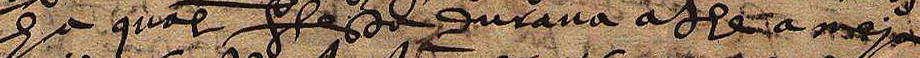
ha qual ffesta duraua athe a meja
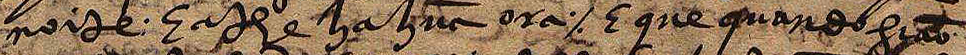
noite. E athe ha hūa ora./. E que quando hião
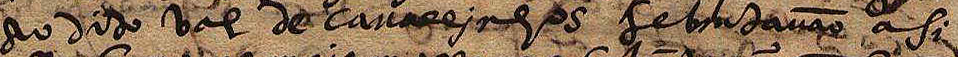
Ao dito val de caualljnhos se vmtauão asi
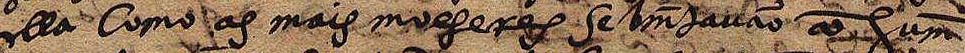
ella Como as mais molheres se vmtauão c̄o hum̄
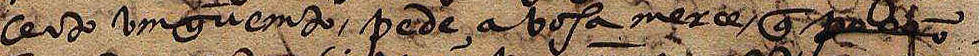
certo vmguemto, pede a vosa merce, q̄ pello
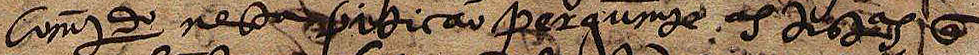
Com̄tdo nesta piticaõ pergūmte as testas q̄
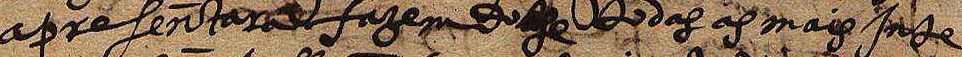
apresen̄tara fazemdolhe todas as mais Jnte
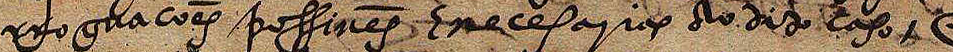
rroguacoẽs possiuēs E necesarias Ao dito caso, e
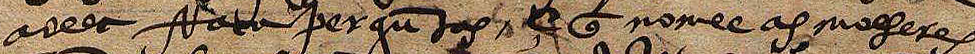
a ella ffaca pergūtas, e q̄ nomee as molheres
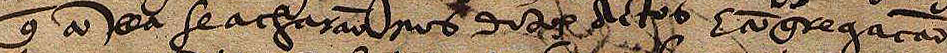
q̄ c̄o ella se acharão nos ditos Actos E c̄ogregacão
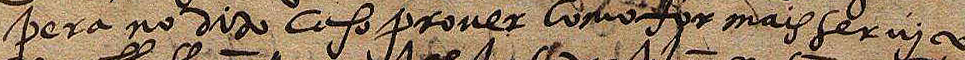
pera no dito Caso prouer Como for mais serujço
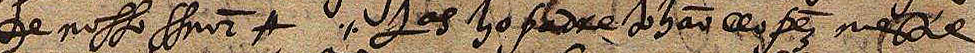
de nosso ssnor̄ item ./. tas ho padre Iohão llopēz mestre
